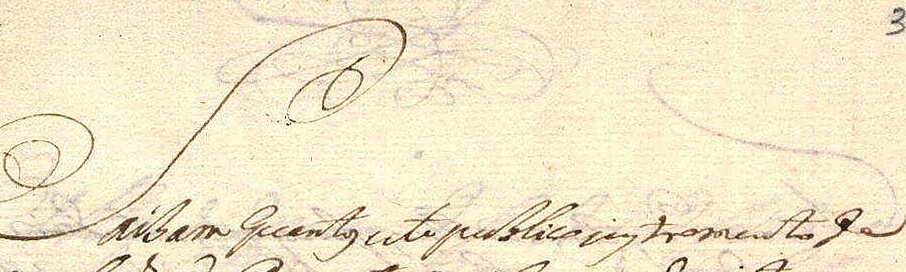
Saibam Quantos este publico instromento de
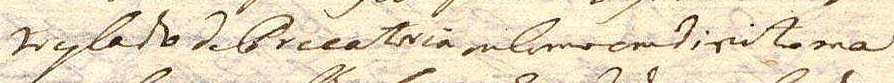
treslado de Precatoria en Como em direito ma
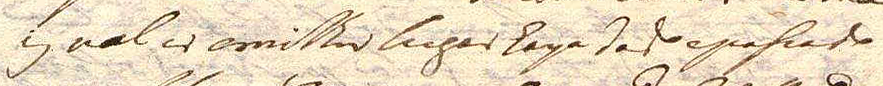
is valer e milhor lugar haya dado e passado
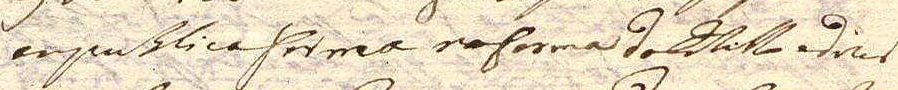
en publica forma na forma do Estillo e dizer
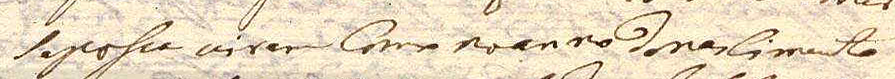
se possa uirem Como no anno do nasCimento
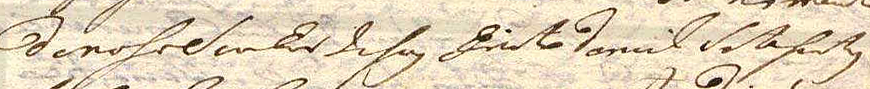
de noso Senhor Iesus christo de mil Setesentos
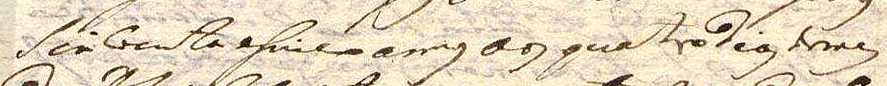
Sincoenta e sinco annos aos quatro dias do mes
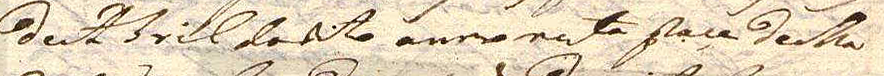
de Abril do dito anno nesta pRaça de Ma
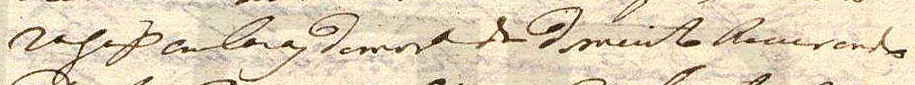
zagaõ em Cazas de morada do muito Reuerendo
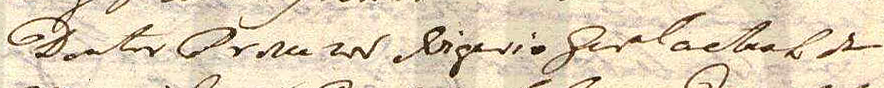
Doutor Prouezor Vigario Geral actual da
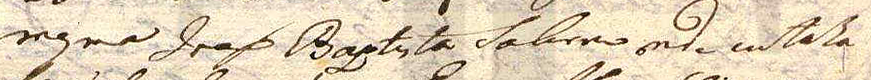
mesma Joaõ Baptista Salerno onde eu taba
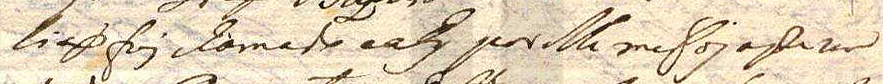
liaõ fuj chamado e ahy por elle me foj aprezen
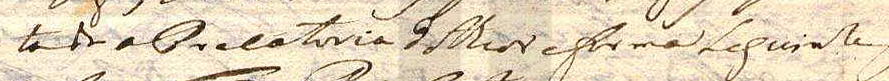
tado a Precatoria de theor e forma seguinte
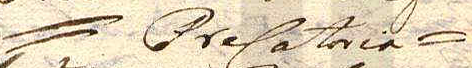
= PreCatoria =
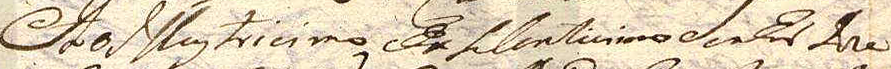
Ao Illustricimo e Exselenticimo Senhor Ioze
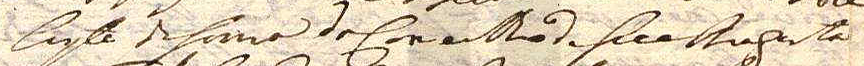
Leyte de Lima do Concelho de sua Magesta
